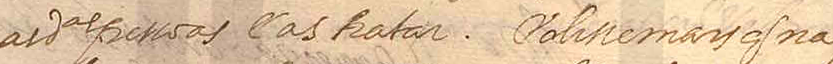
as das pessoas E as tratar. E disse mais q̄ naõ
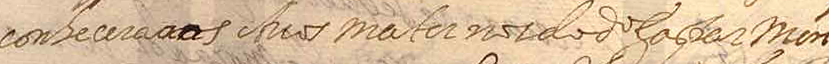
conhecera aos Auos maternos do do Gaspar Montro
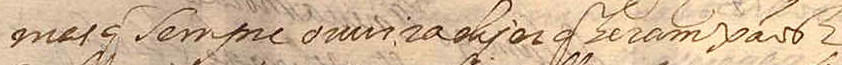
mas q̄ sempre ouuira dizer q̄ heram xãos
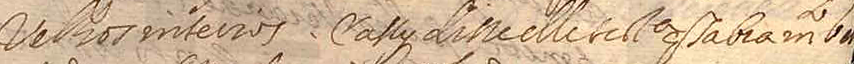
Velhos inteiros. E assy disse elle testa q̄ sabia mto b
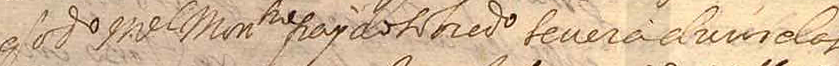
q̄ o do Mel Montro pay do sobredo teuera duuidas
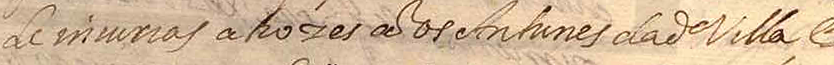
de iniurias atrozes cō os Antunes da da Villa, E
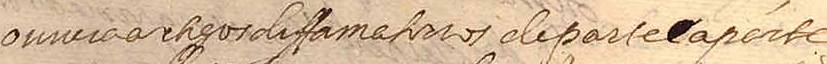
ouuera artigos diffamatorios de parte a parte
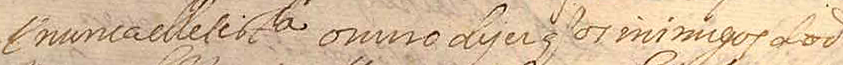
E nunca elle testa ouuio dizer q̄ os inimigos do do
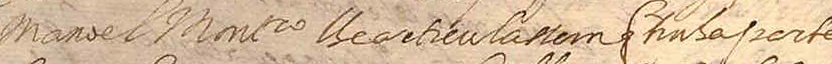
Manoel Montro lhe articulassem q̄ tinha parte
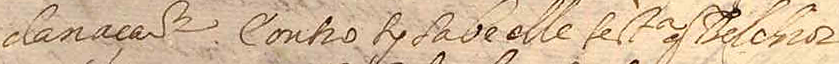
da naçaõ E outrosy sabe elle testa q̄ Belchior
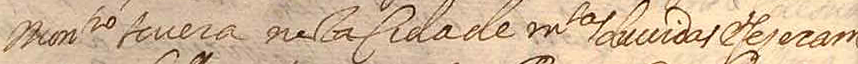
Montro teuera nesta Cidade mtas duuidas E fezeram
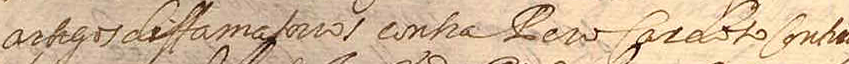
artigos diffamatorios contra Pero Cardoso Coutin
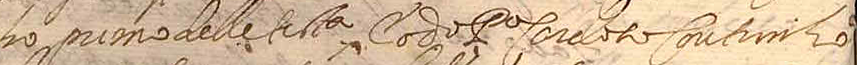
ho primo delle testa, E o do Po Cardoso Coutinho
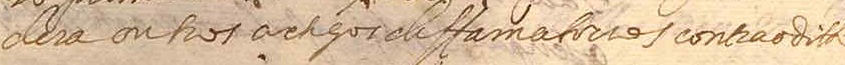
dera outros artigos diffamatorios contra o ditto
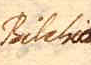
Belchior
